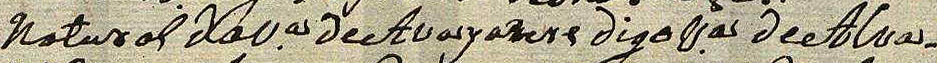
natural da V.a de Avayazere digo V.a de Alva
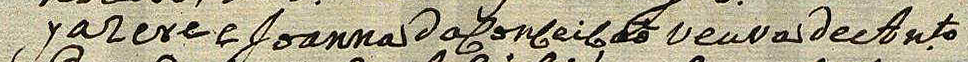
yazere e Joanna da ConceiÇaõ veuva de Ant.o
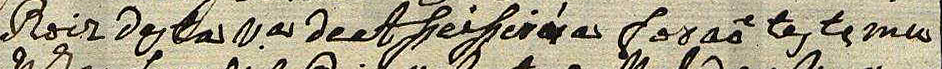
Roiz desta V.a de Asseisseira Foraõ testemu
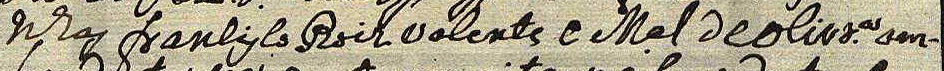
nhas francisco Roiz valente e M.el de olivr.a am
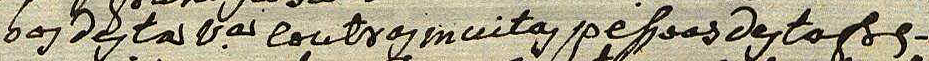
bos desta v.a e outras muitas pessoas desta fre
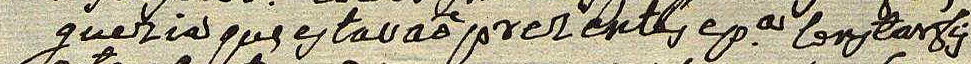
guezia que estavaõ prezentes e p.a Constar fis
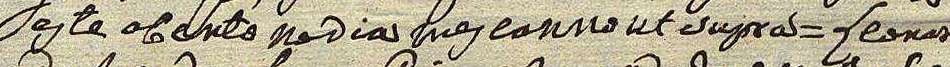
este aCento no dia mes e anno ut supra = Leonar
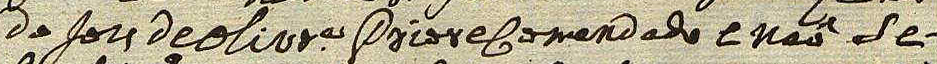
do Joze de olivr.a Prior eComendado e naõ Se
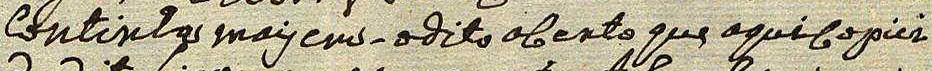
continha mais em- o dito oCento que aqui Copiei
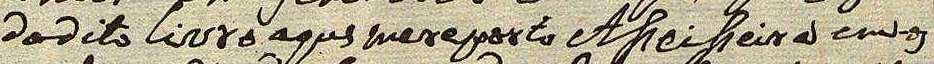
do dito livro a que me reporto Asseisseira em os
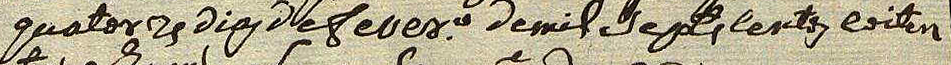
quatorze dias de fever.o de mil septecentos e oiten
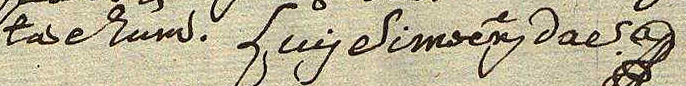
ta e hum. Luis Simoens da S.a
